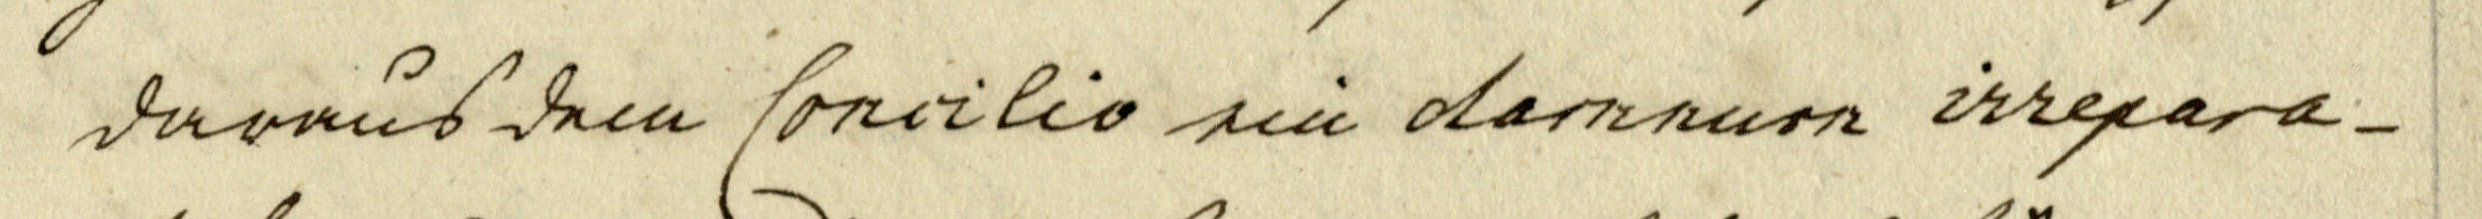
daraus dem Concilio ein damnum irrepara¬
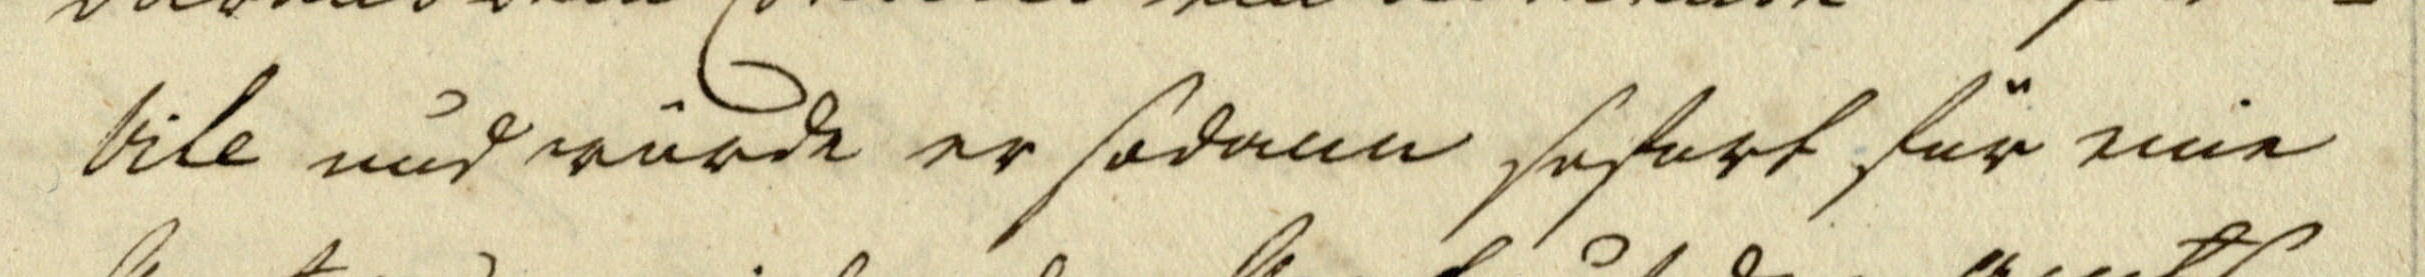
bile und würde er sodann sofort für eine
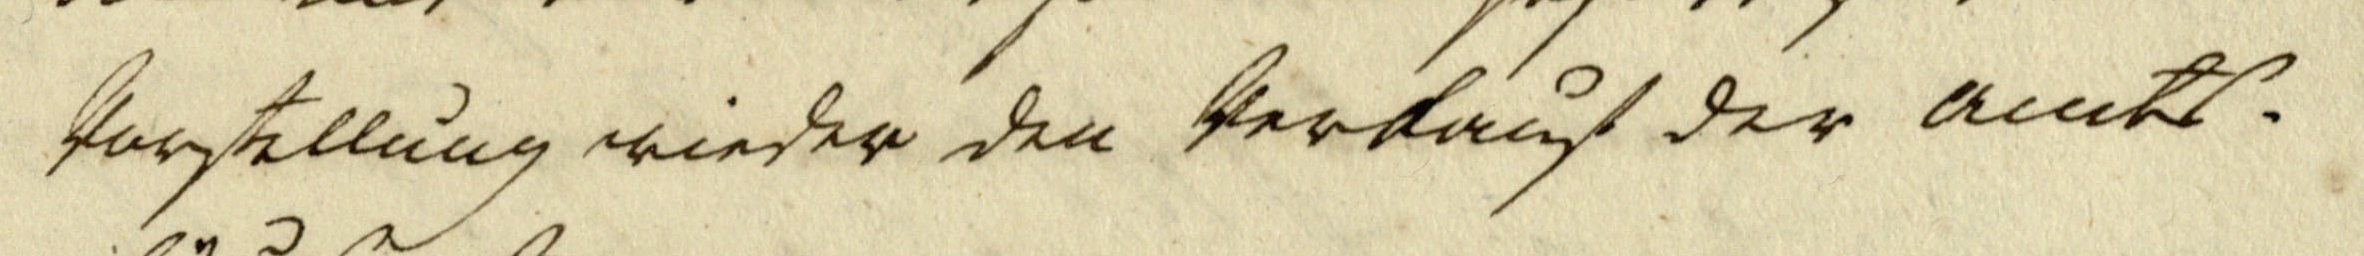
Vorstellung wieder den Verkauf der Amts¬
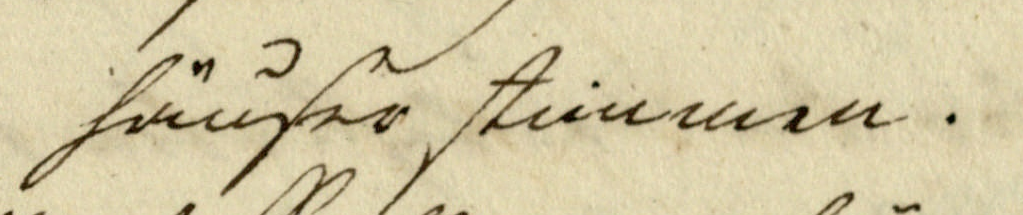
häuser stimmen.
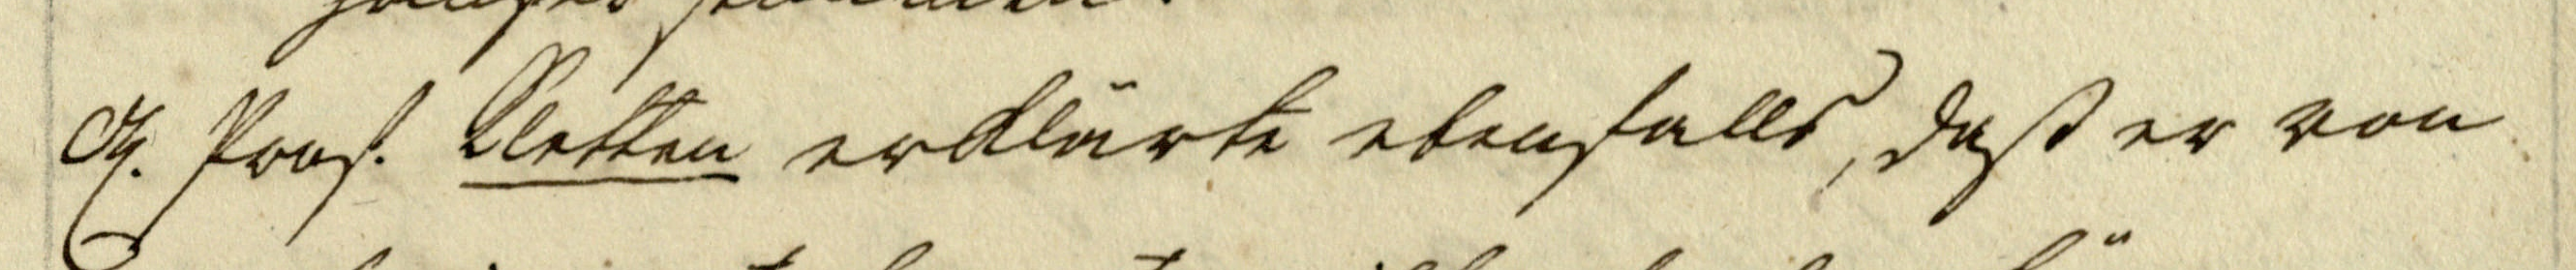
dh. Prof. Kletten erklärte ebenfalls, daß er von
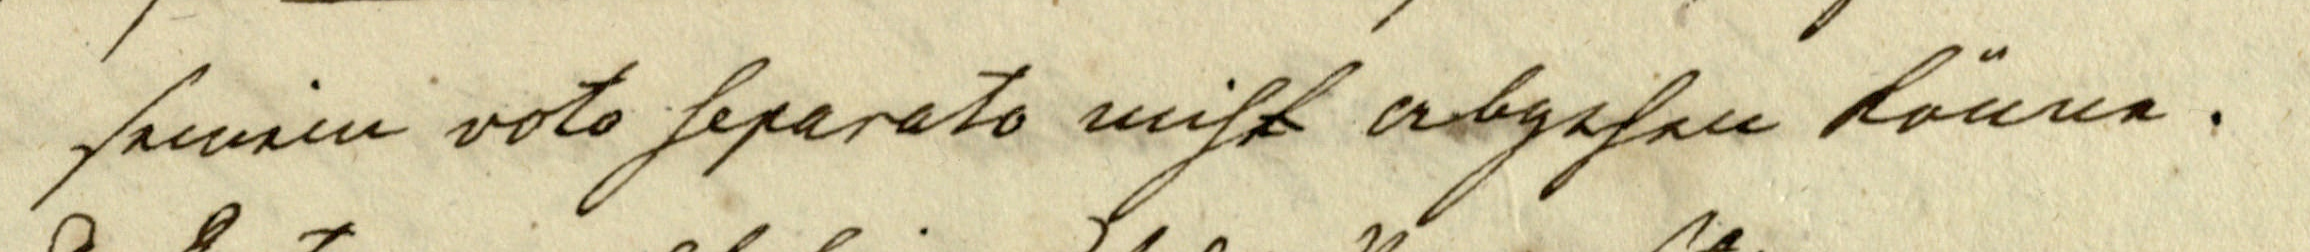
seinem voto separato nicht abgehen könne.
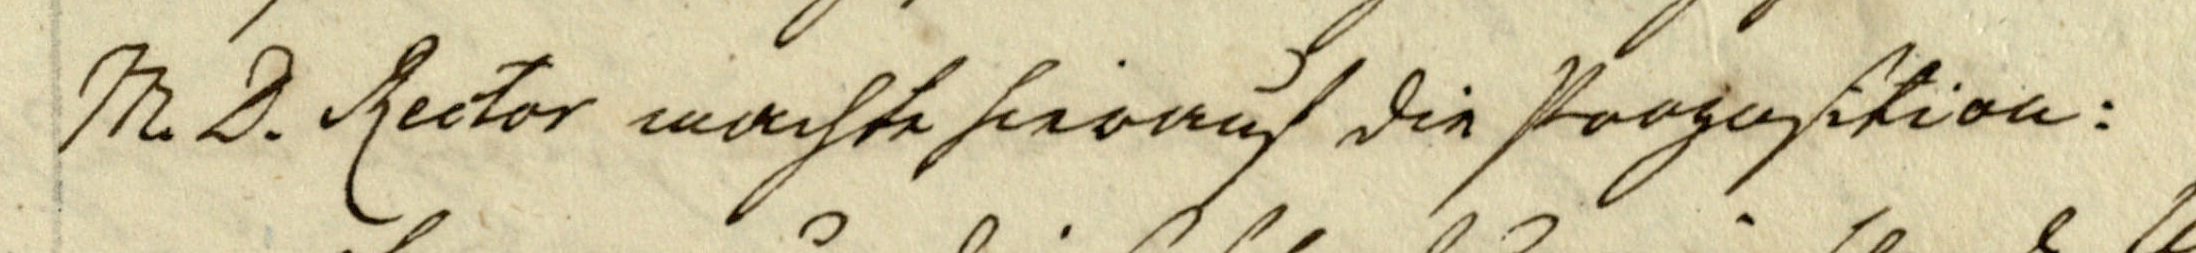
M. D. Rector machte hierauf die Proposition:
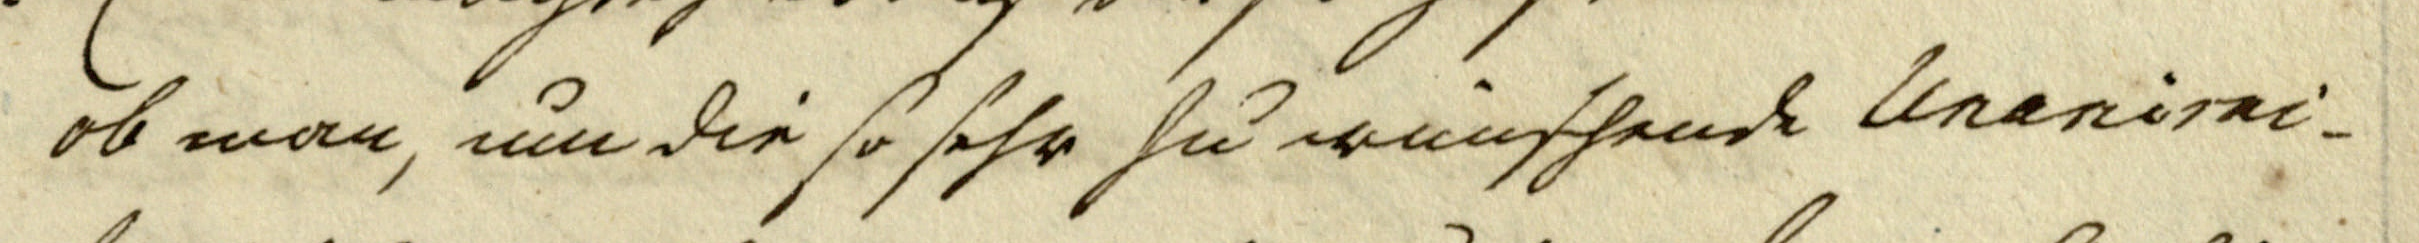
ob man, um die so sehr zu wünschende Unanimi¬
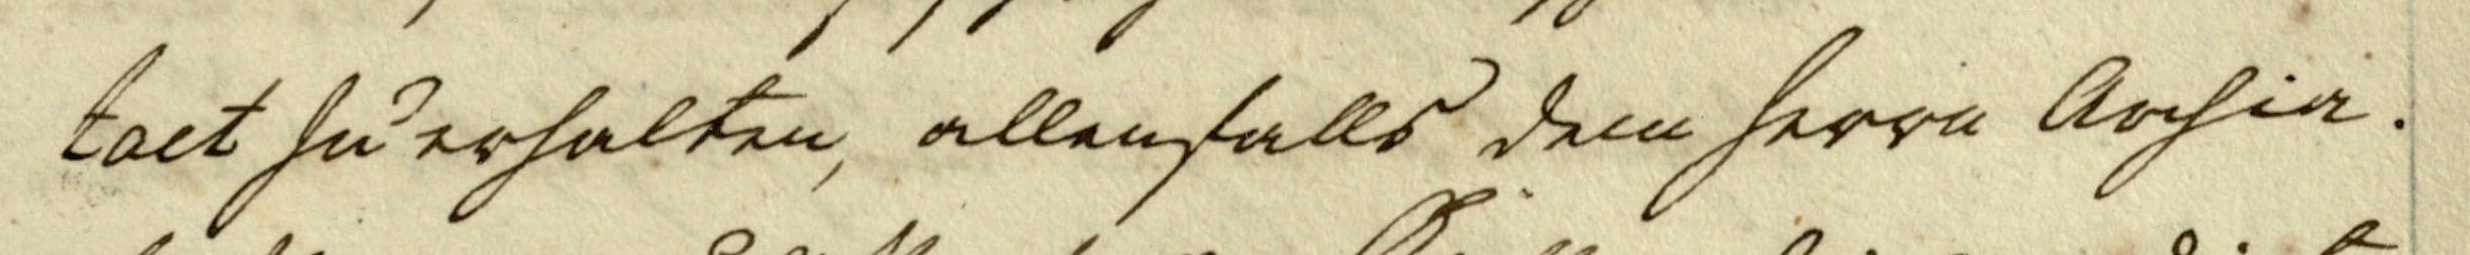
taet zu erhalten, allenfalls dem Herrn Archia¬
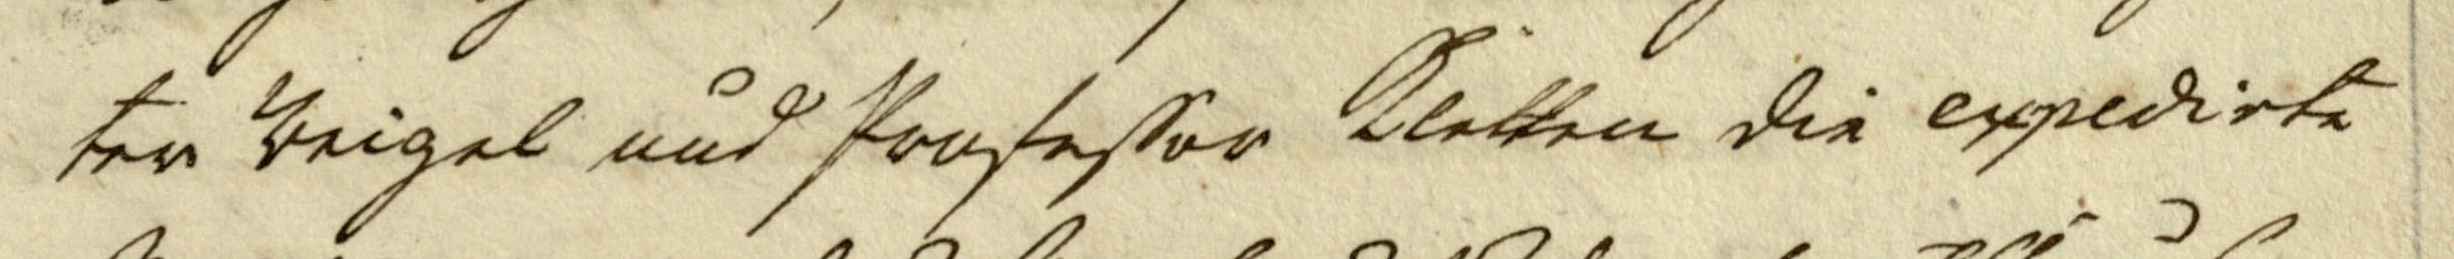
ter Weigel und Professor Kletten die expedirte
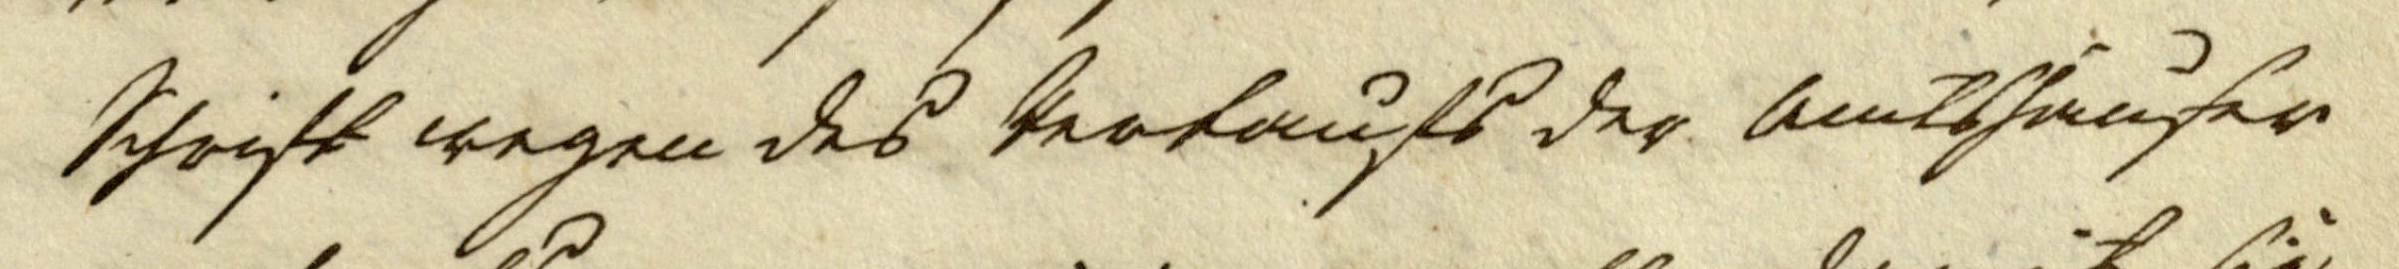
Schrift wegen des Verkaufs der Amtshäuser
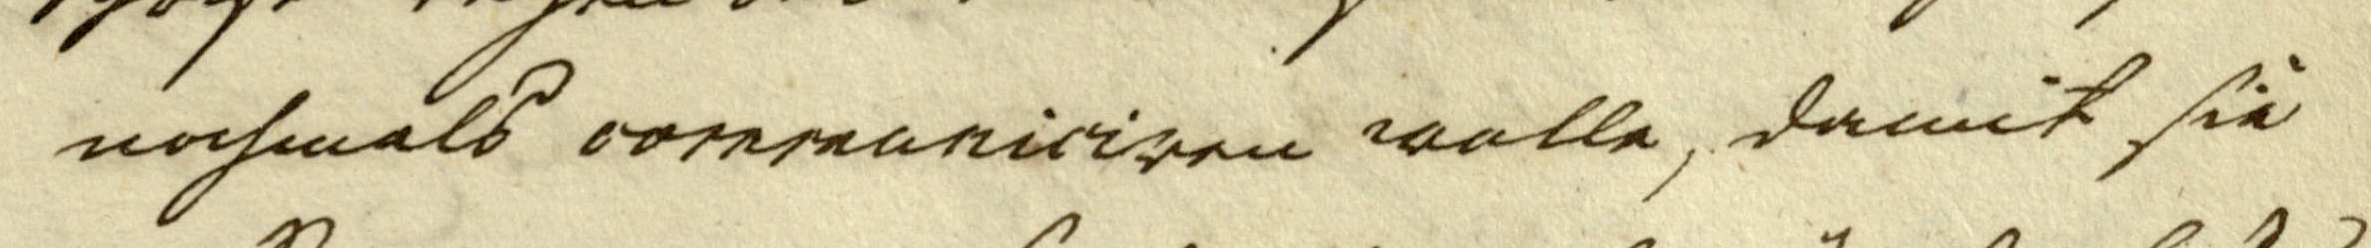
nochmals communiciren wolle, damit sie
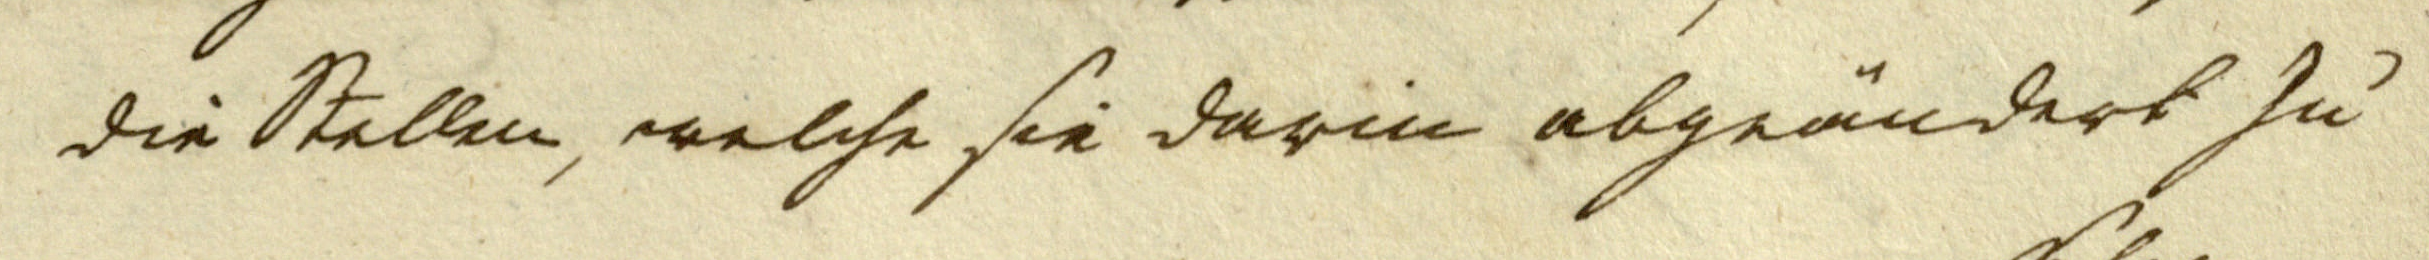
die Stellen, welche sie darin abgeändert zu
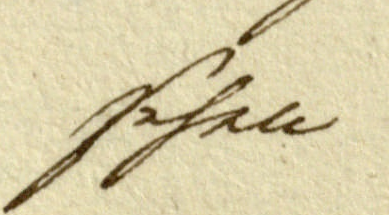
sehen
